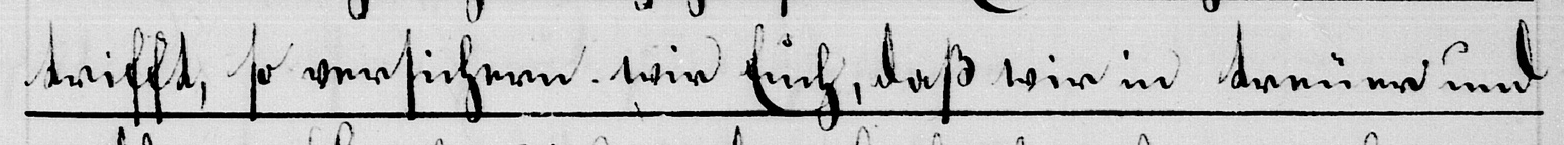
trifft, so versichern wir Euch, daß wir in treuer und
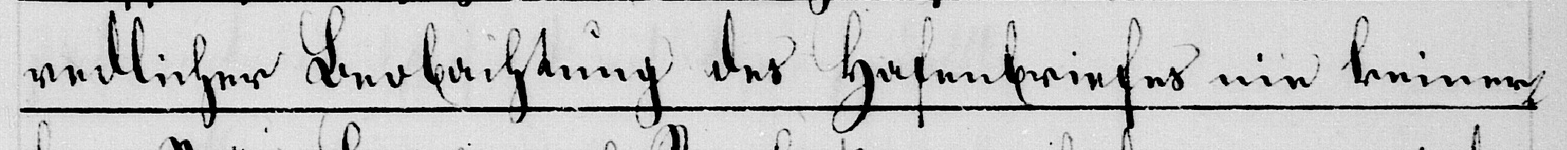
redlicher Beobachtung des Hafenbriefes ein keiner¬
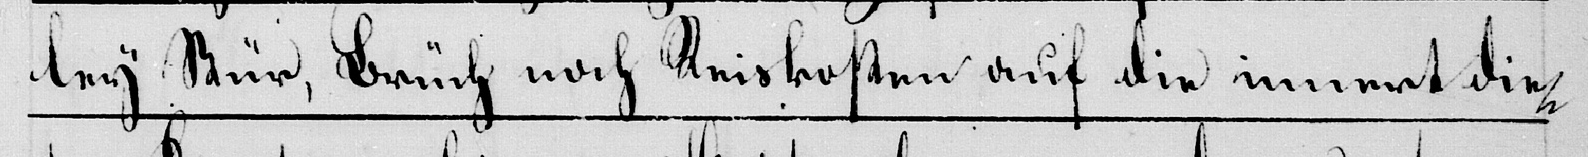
ley Stür, Brüch noch Reiskosten auf die innert die¬
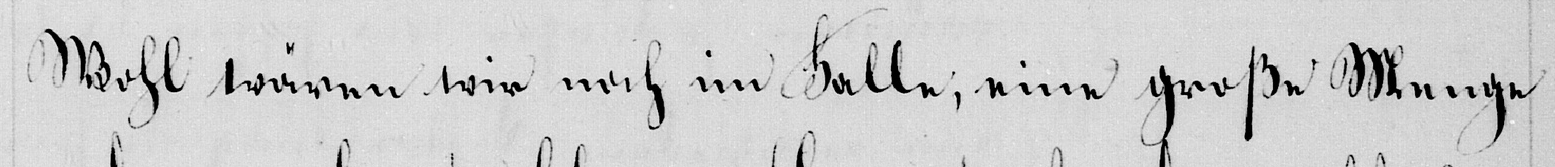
Wohl wären wir noch im Falle, eine große Menge
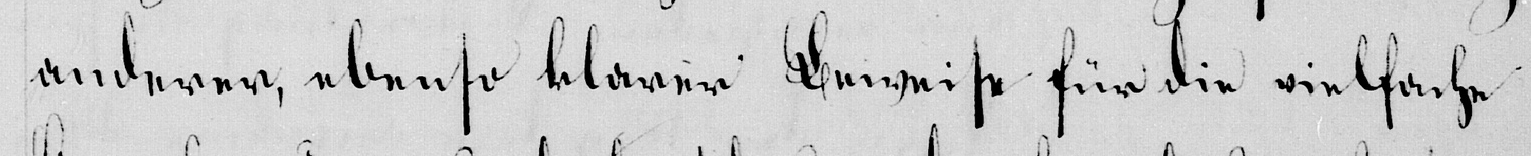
anderer, ebenso klarer Beweise für die vielfache
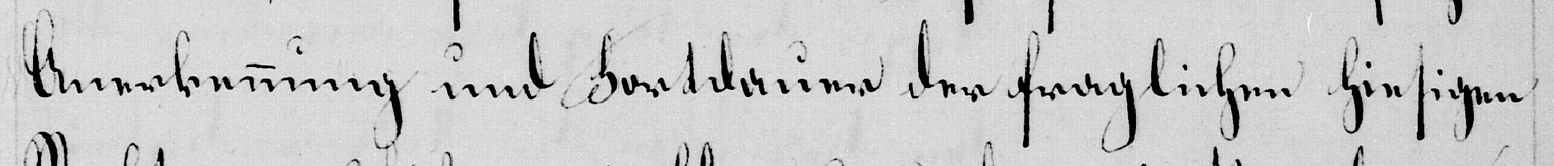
Anerkennung und Fortdauer der fraglichen hiesigen
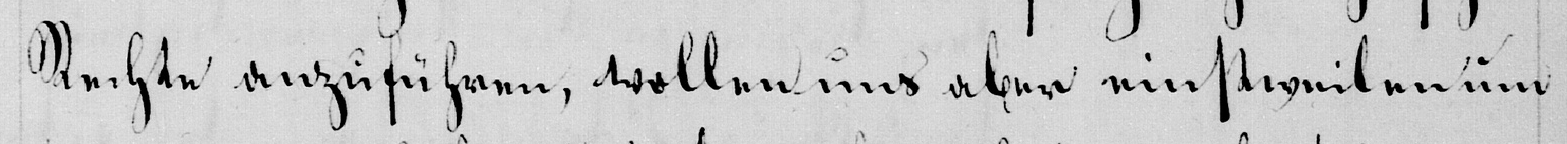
Rechte anzuführen, wollen uns aber einstweilen um
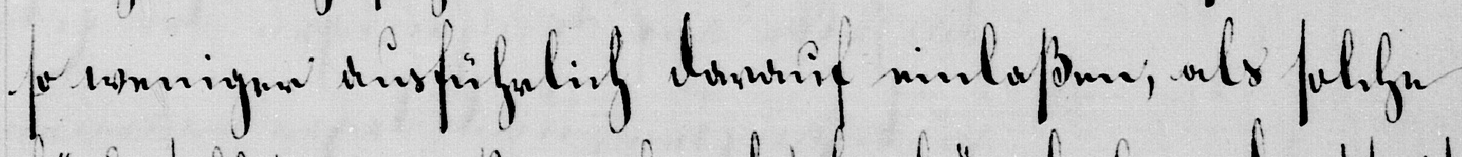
so weniger ausführlich darauf einlaßen, als solche
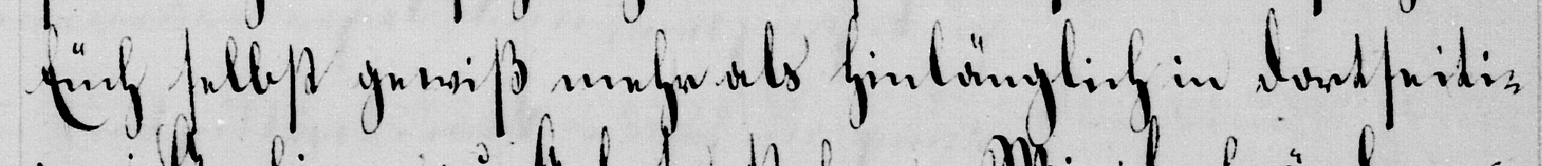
Euch selbst gewiß mehr als hinlänglich in dortseiti¬
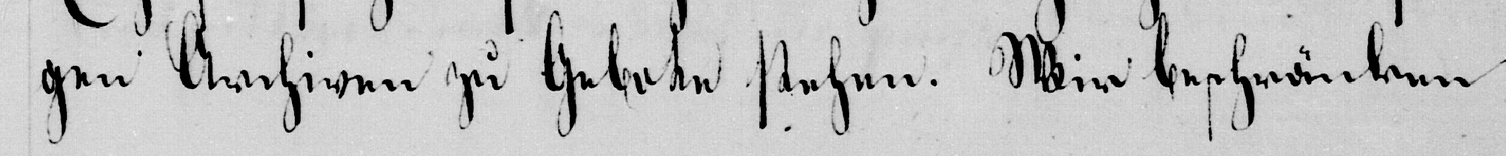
gen Archiven zu Gebote stehen. Wir beschränken
